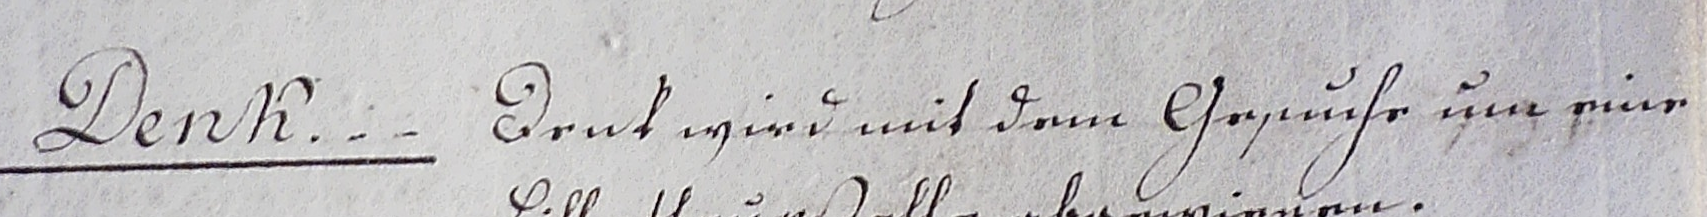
Denk. .. .. Denk wird mit dem Gesuche um eine
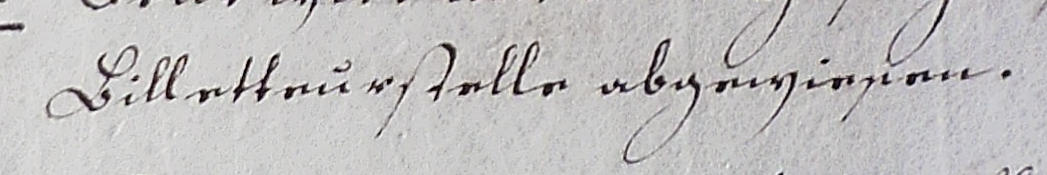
Billetteurstelle abgewiesen.
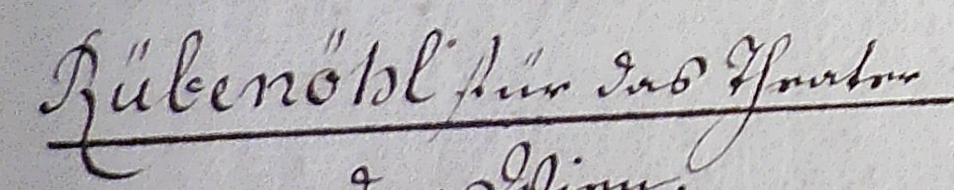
Rübenöhl für das Theater
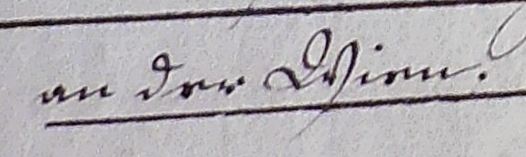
an der Wien.
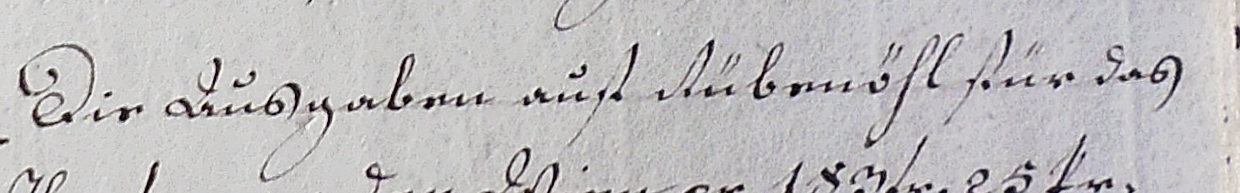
Die Ausgaben auf Rübenöhl für das
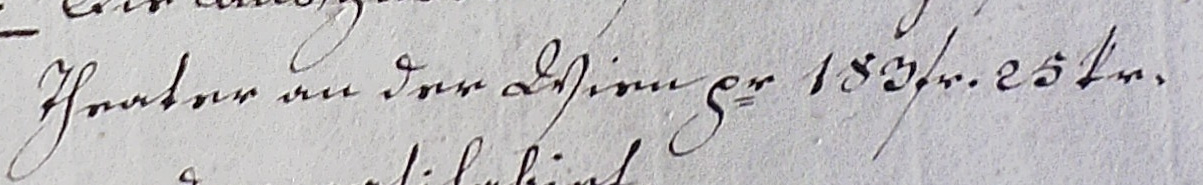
Theater an der Wien pr͇ 183fr. 25kr.
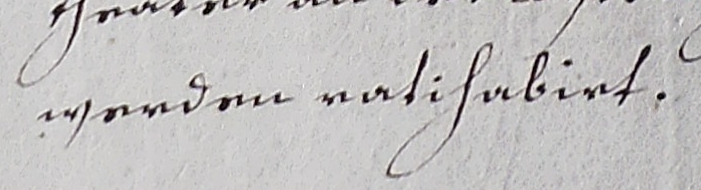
werden ratihabirt.
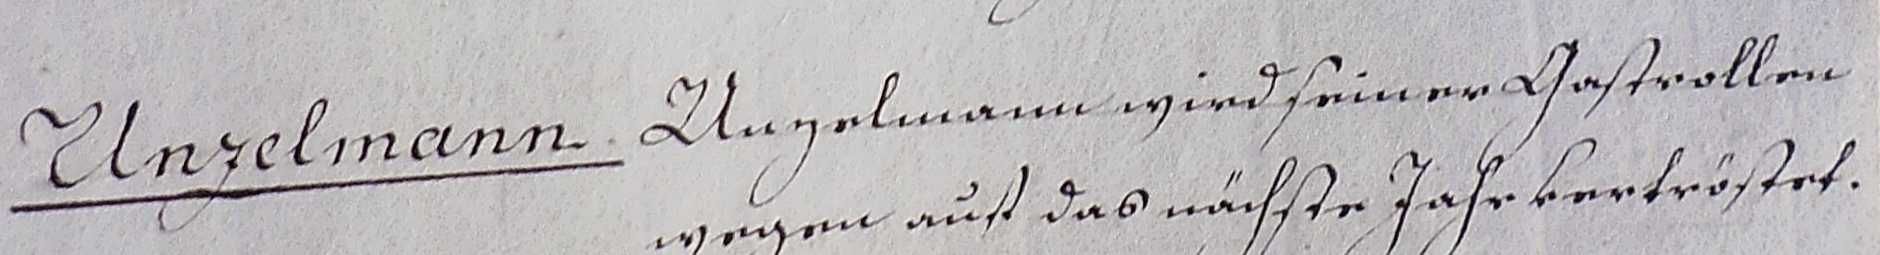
Unzelmann Unzelmann wird seiner Gastrollen
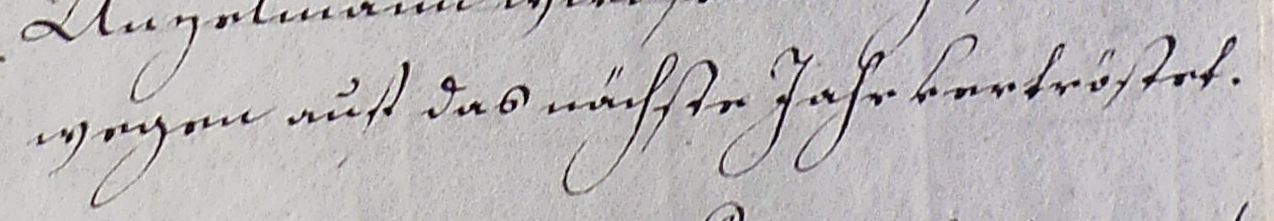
wegen auf das nächste Jahr vertröstet.
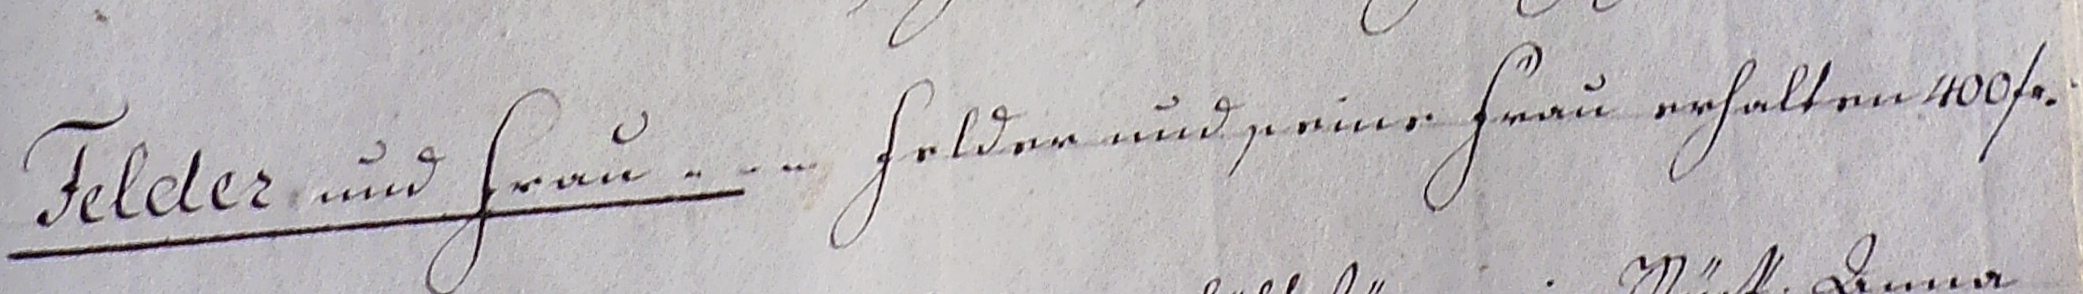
Felder und Frau .. .. .. Felder und seine Frau erhalten 400fr.
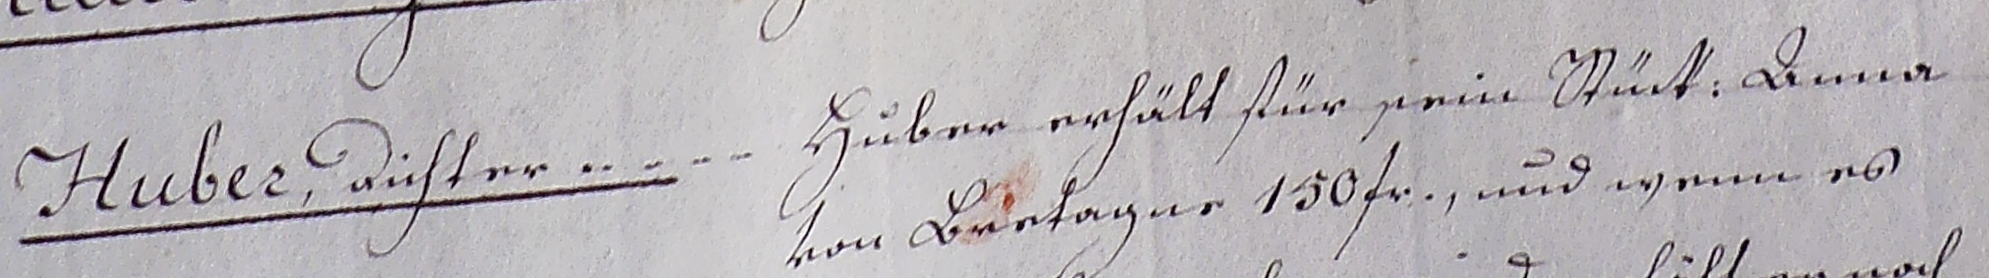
Huber, Dichter .. .. .. .. Huber erhält für sein Stück: Anna
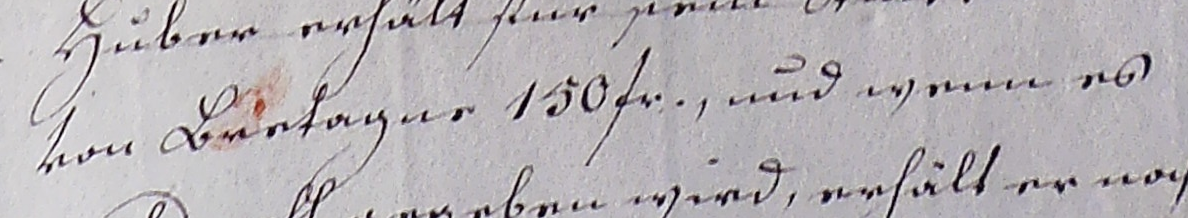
von Bretagne 150fr., und wenn es
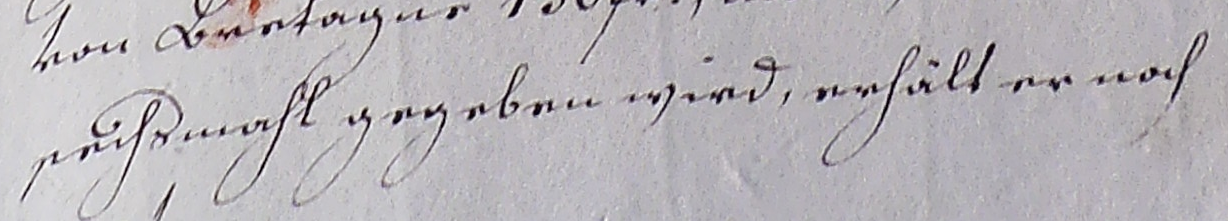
sechsmahl gegeben wird, erhält er noch
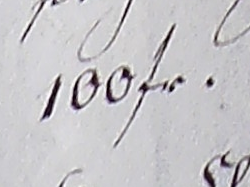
100fr.
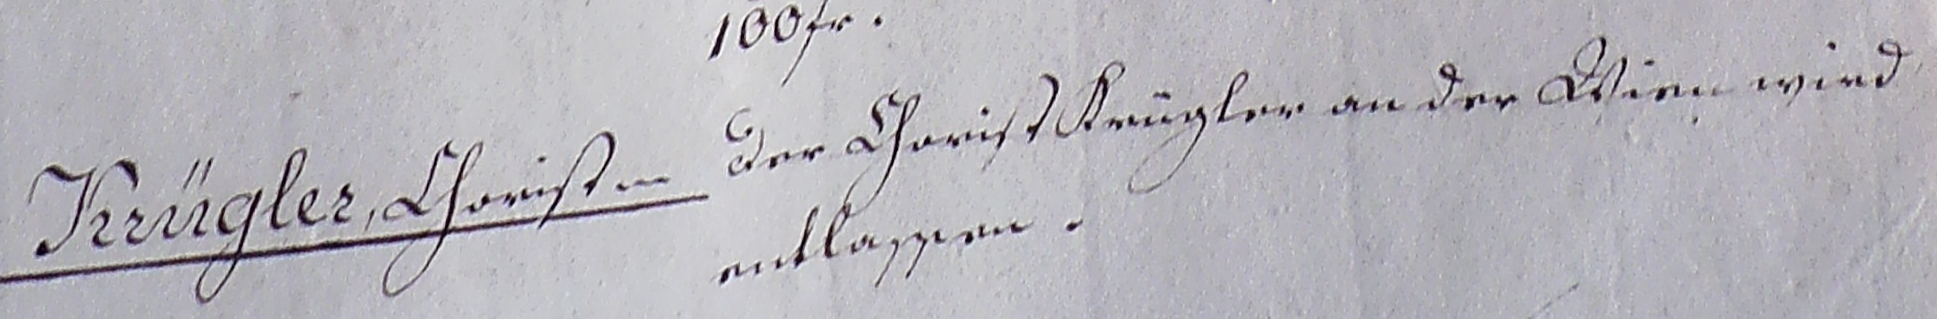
Krügler, Chorist ... Der Chorist Krügler an der Wien wird
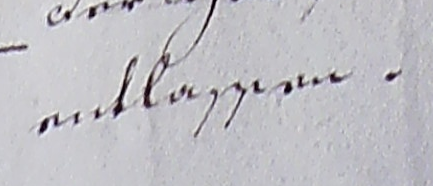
entlassen.
